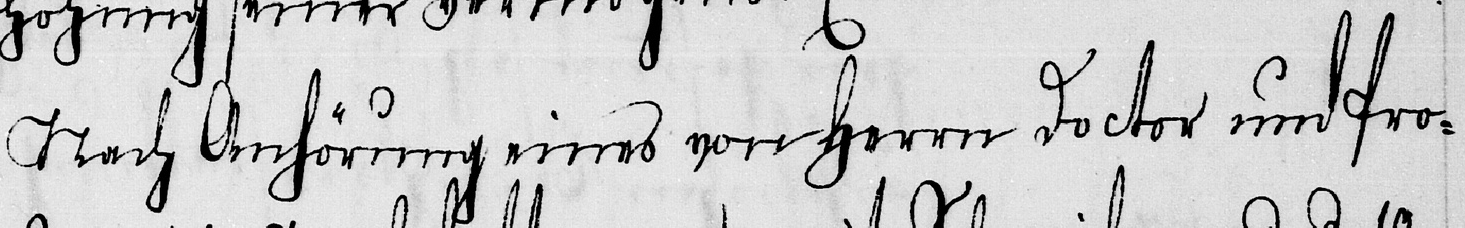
Nach Anhörung eines von Herrn Doctor und Pro¬
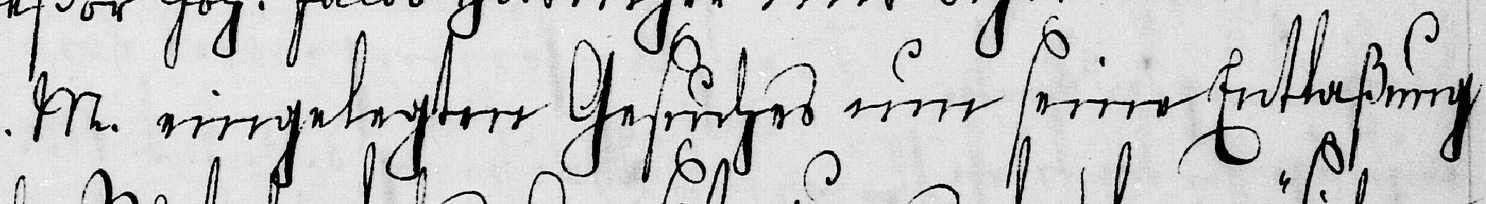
M. eingelegten Gesuches um seine Entlaßung
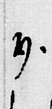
v.
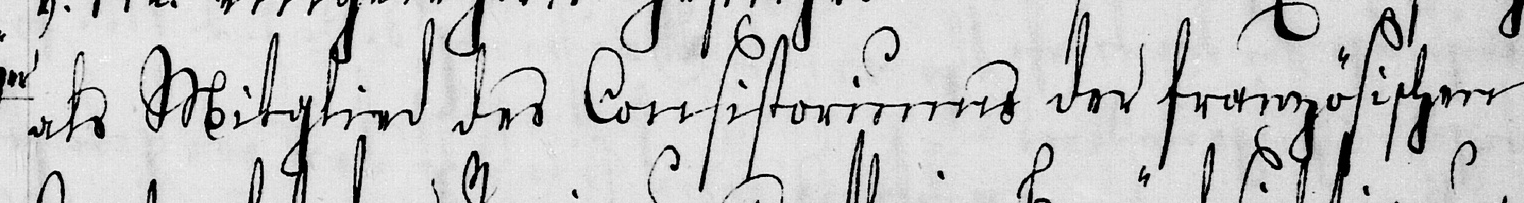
als Mitglied des Consistoriums der französischen
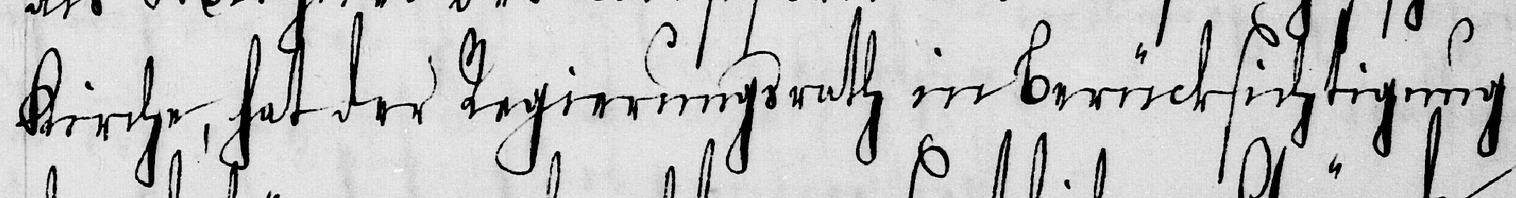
Kirche, hat der Regierungsrath in Berücksichtigung
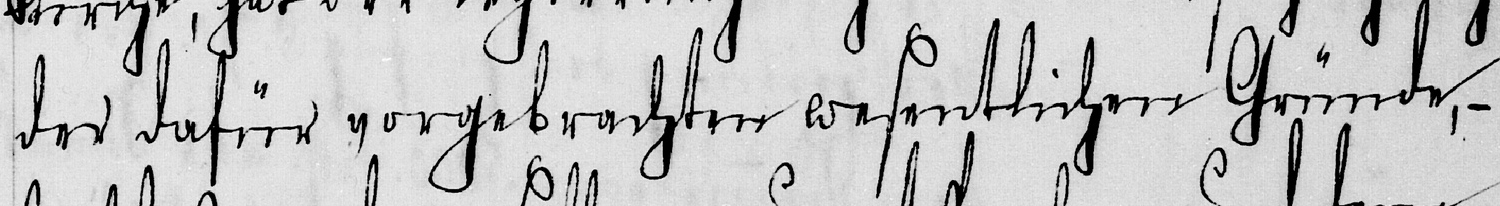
der dafür vorgebrachten wesentlichen Gründe,
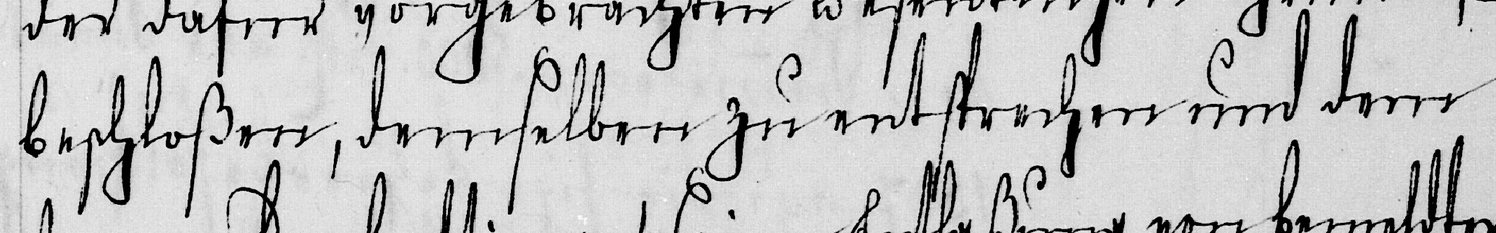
beschloßen, demselben zu entsprechen und dem
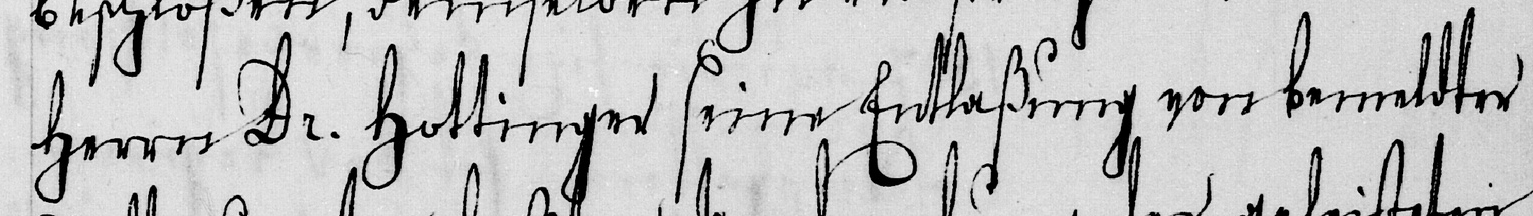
Herrn Dr. Hottinger seine Entlaßung von bemeldter
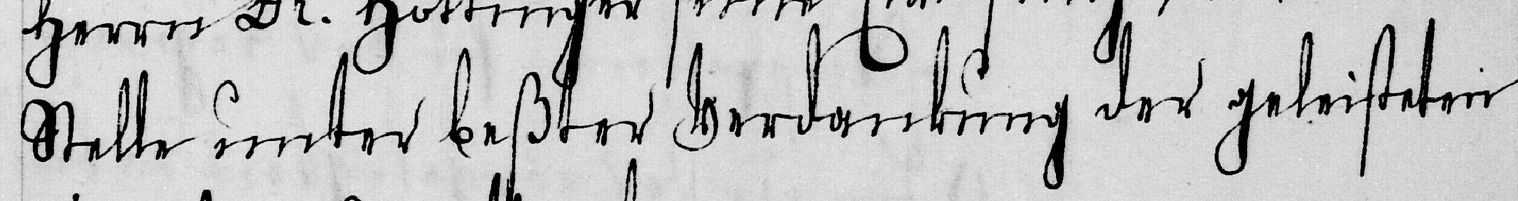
Stelle unter beßter Verdankung der geleisteten
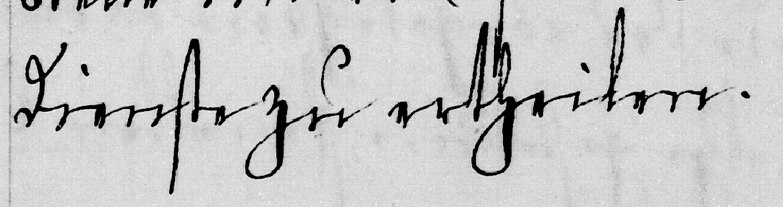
Dienste zu ertheilen.
